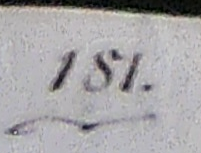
181.
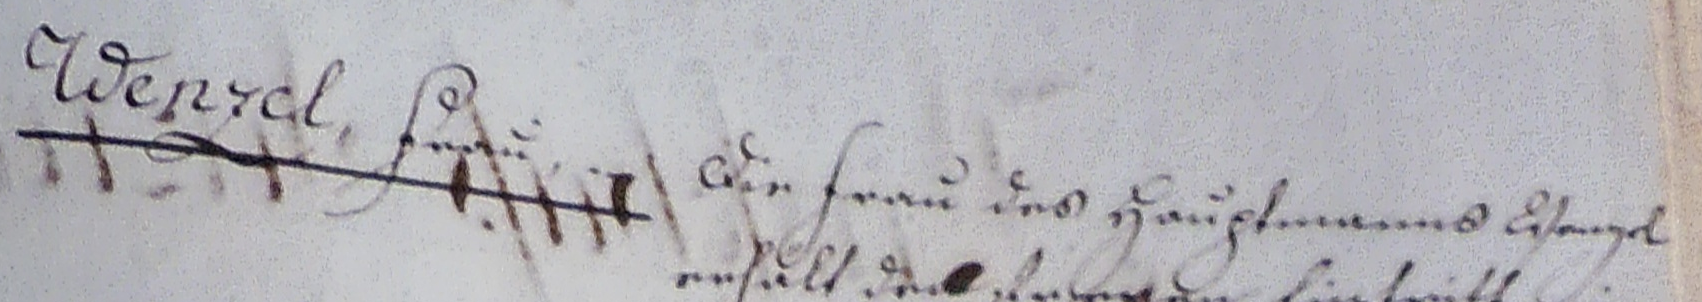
Wenzel, Frau, .. Die Frau des Hauptmanns Wenzel
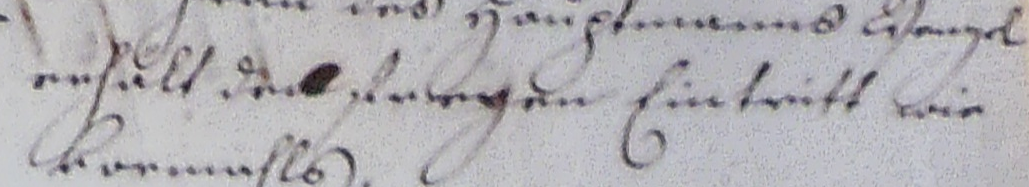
erhält den freyen Eintritt wie
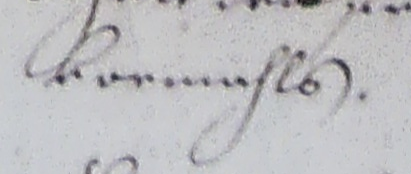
vormahls.
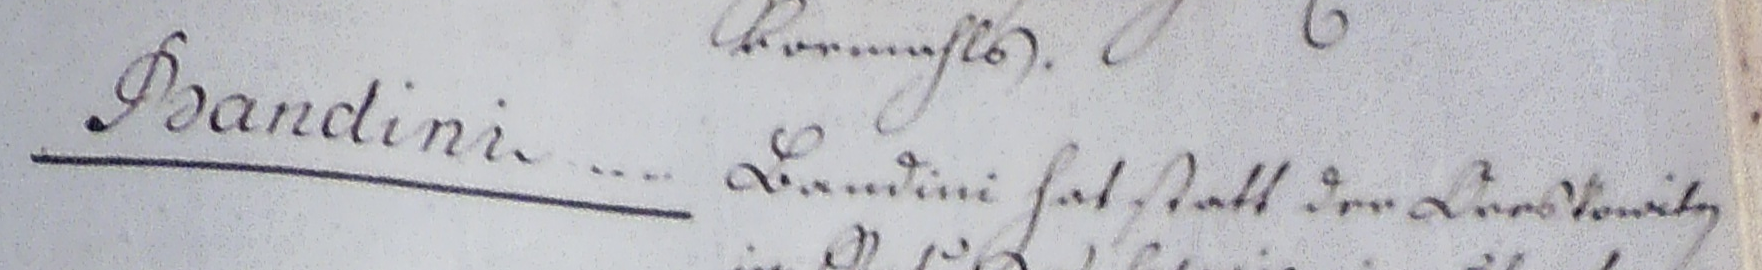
Bandini. .. .. Bandini hat statt der Oreskowitz
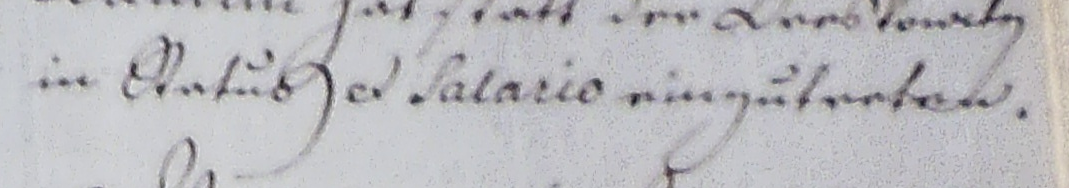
in Status et Salario einzutreten.
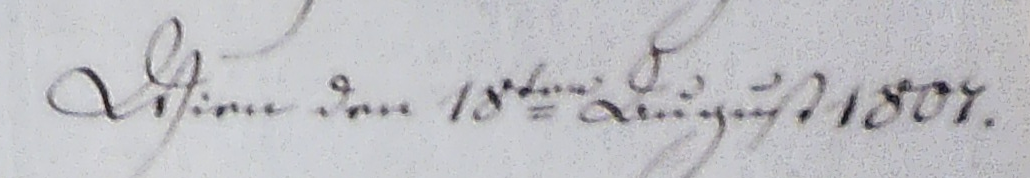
Wien den 18te͇n August 1807.
